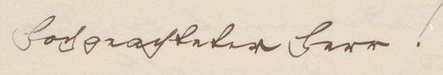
Hochgeachteter Herr!
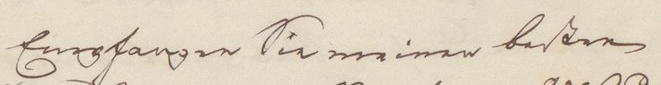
Empfangen Sie meinen besten
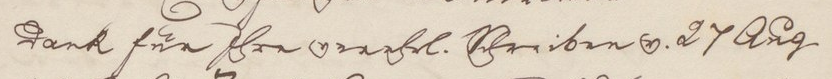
Dank für Ihre verehrl. Schreiben v. 27 Aug
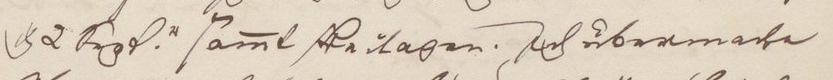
& 2 Septr sammt Beilagen. Ich übermache
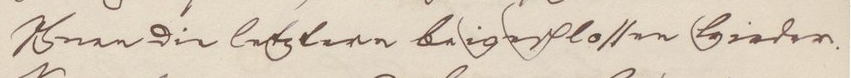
Ihnen die letztern beigeschlossen wieder.
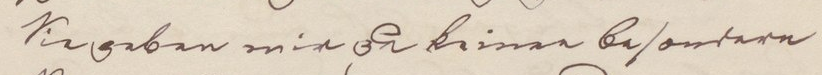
Sie gaben mir zu keinen besondern
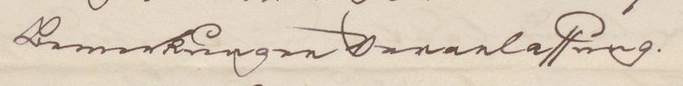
Bemerkungen Veranlassung.
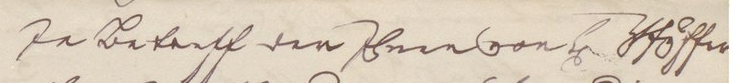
In Betreff der Ihnen von Herrn Pfyffer
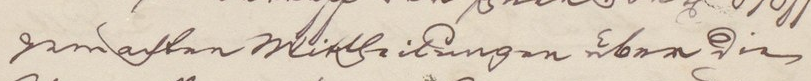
gemachten Mittheilungen über die
